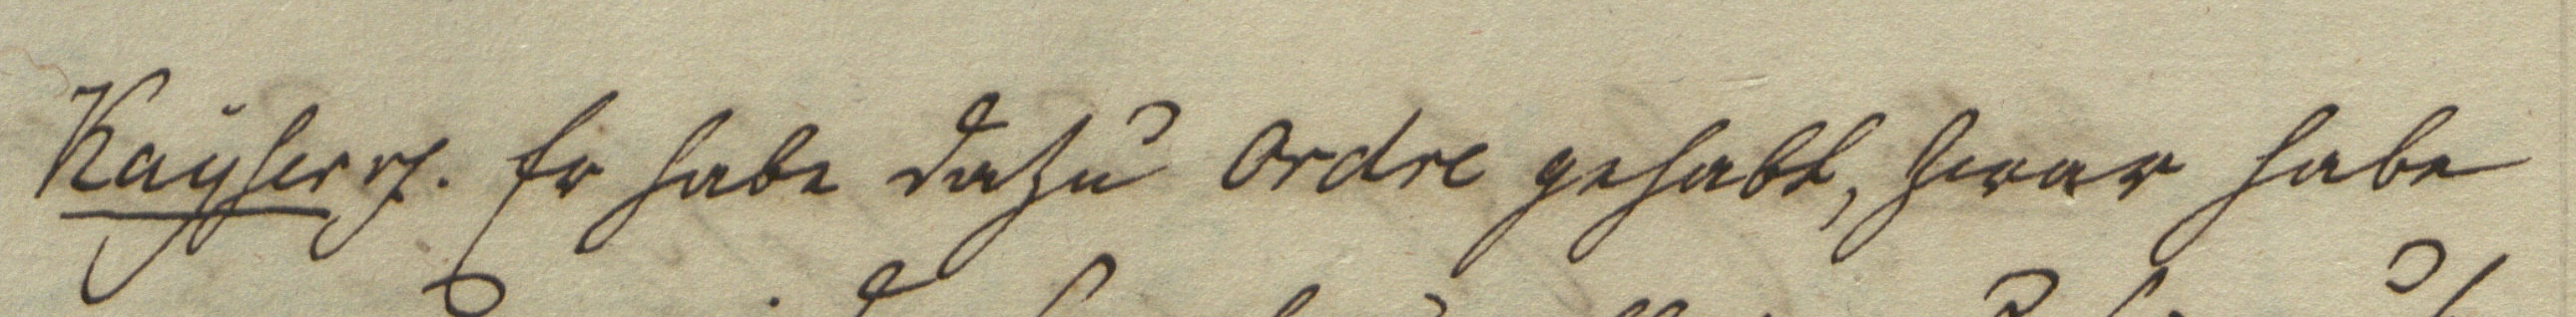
Kaÿser rf. Er habe dazu Ordre gehabt, zwar habe
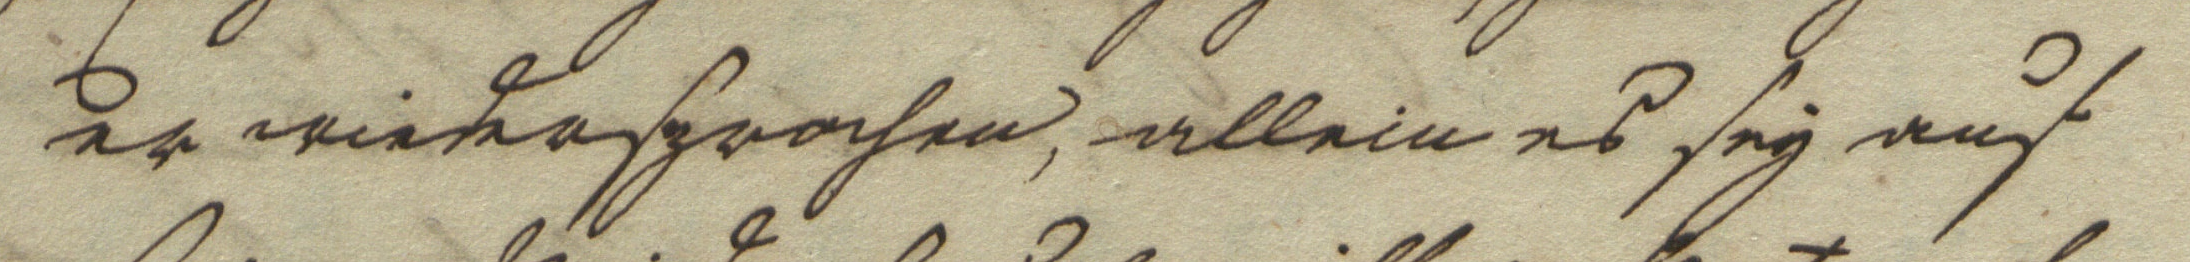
er wiedersprochen, allein es seÿ auf
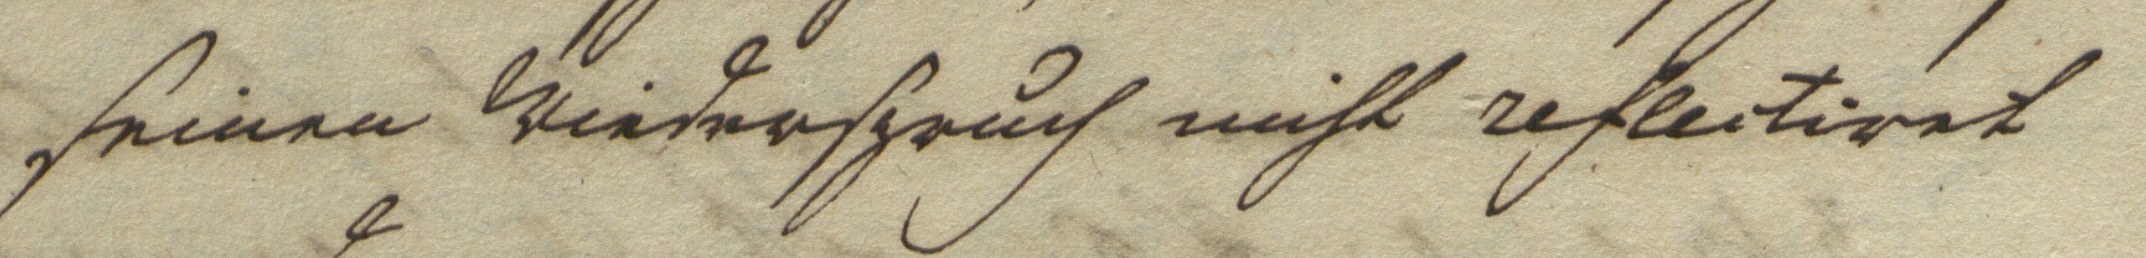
seinen Wiederspruch nicht reflectiret
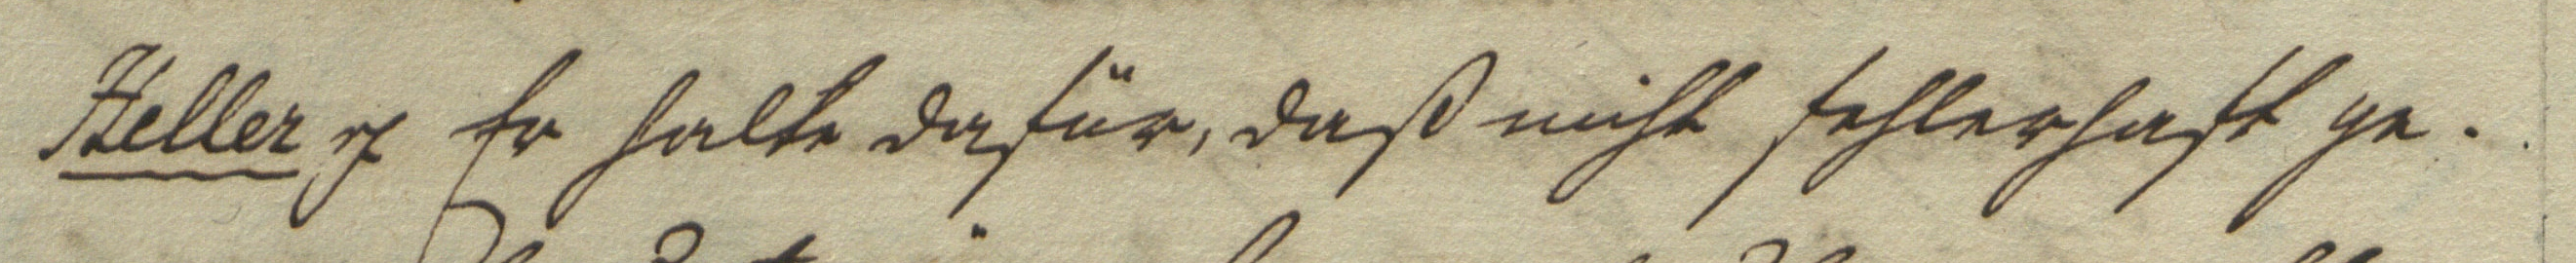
Heller rf. Er halte dafür, daß nicht fehlerhaft ge¬
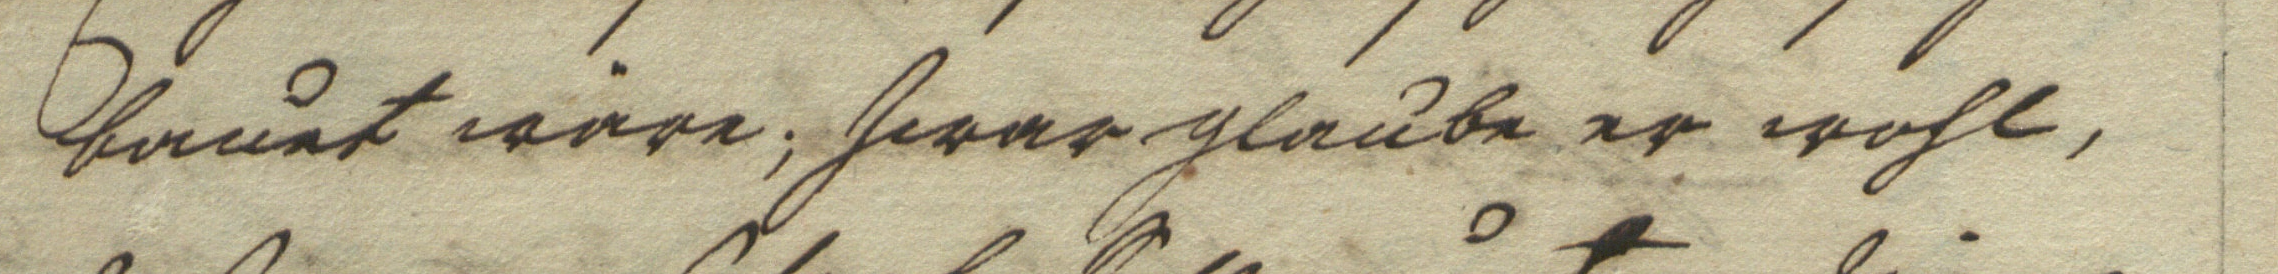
bauet wäre; zwar glaube er wohl,
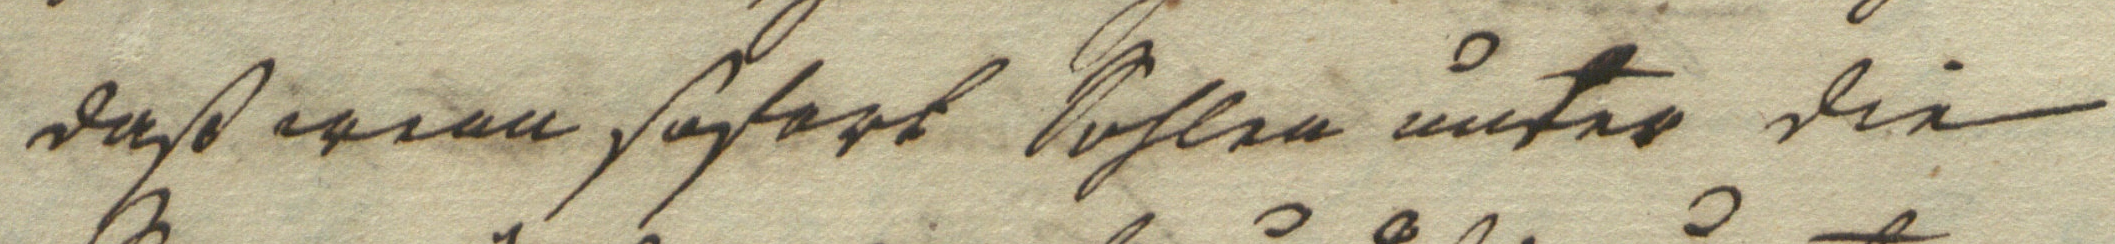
daß wenn sofort Sohlen unter die
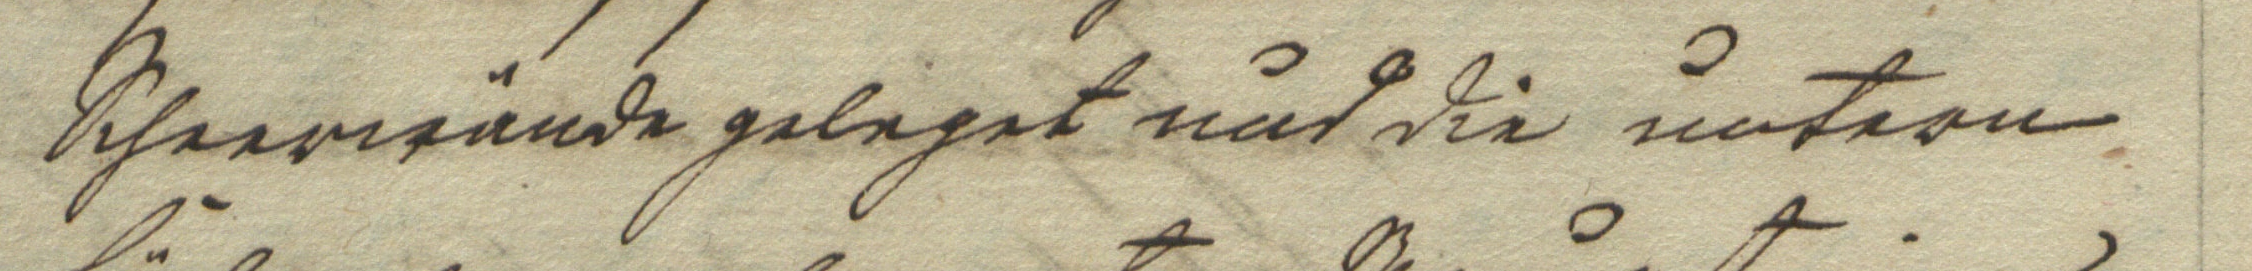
Scheerwände geleget und die untern
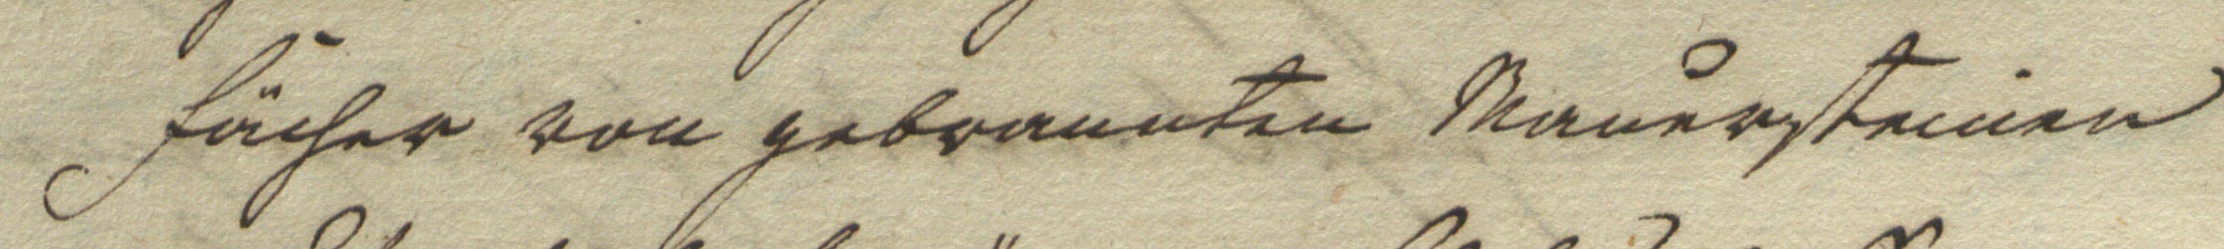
Fächer von gebrannten Mauersteinen
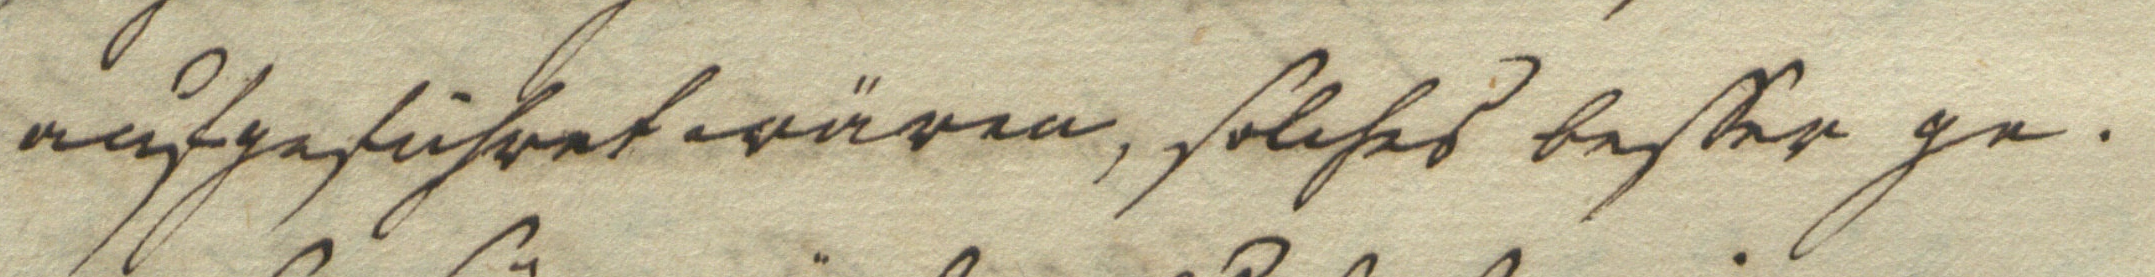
aufgeführet wären, solches besser ge¬
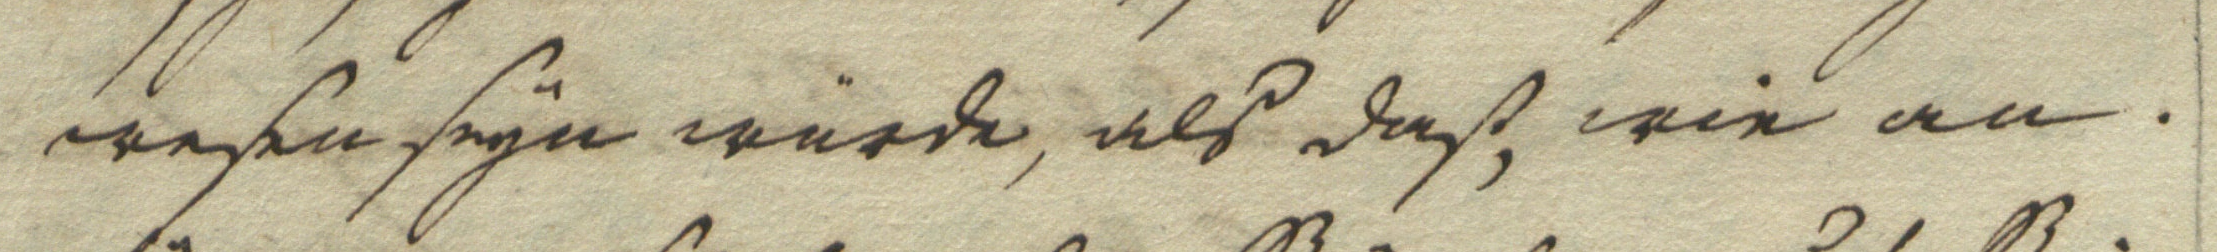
wesen seÿn würde, als daß, wie an¬
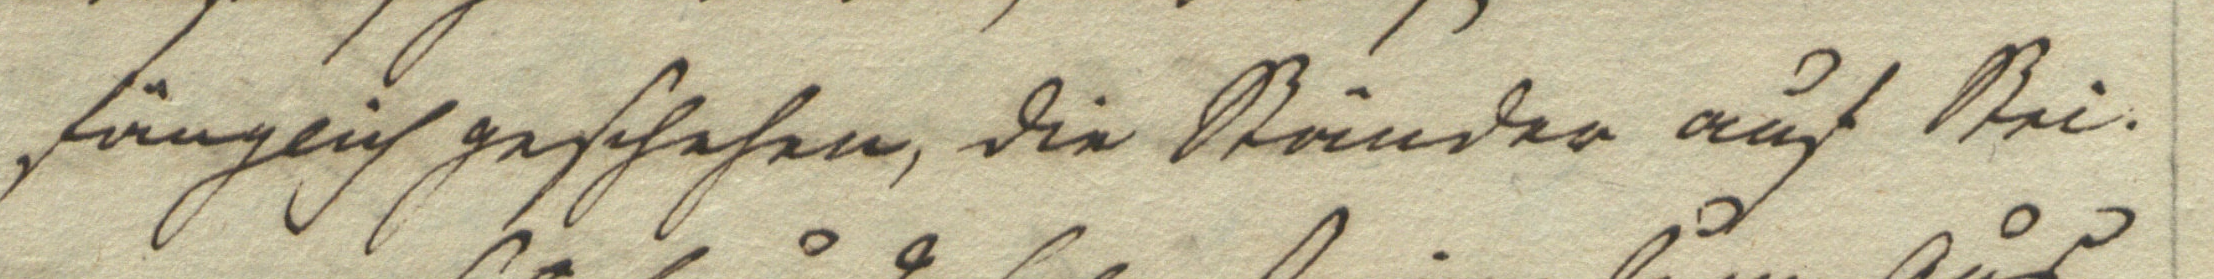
fänglich geschehen, die Ständer auf Stei¬
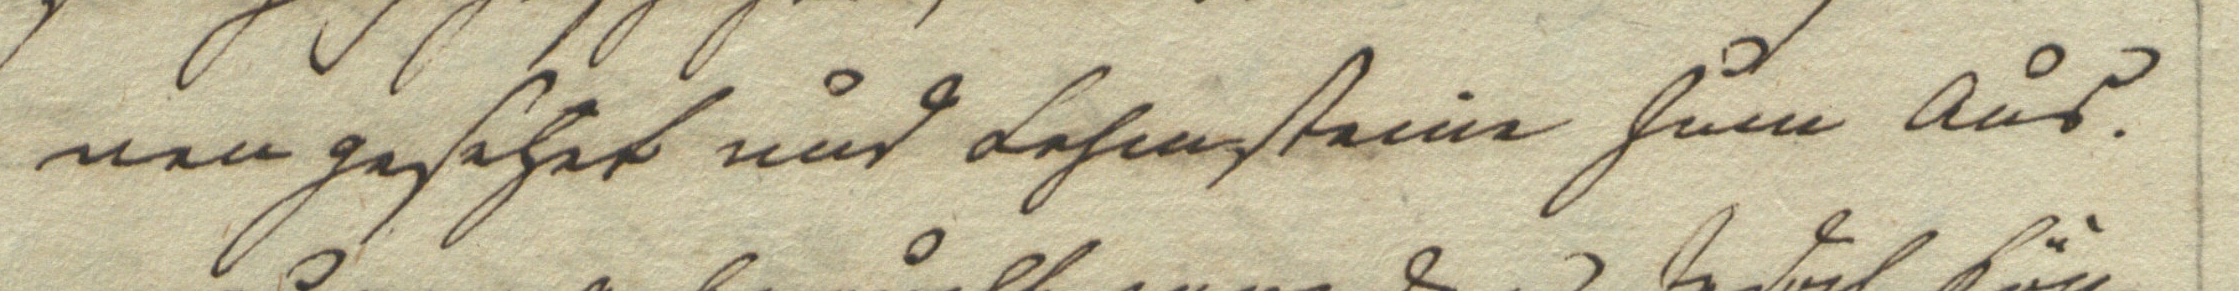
nen gesetzet und Lehmsteie zum Aus¬
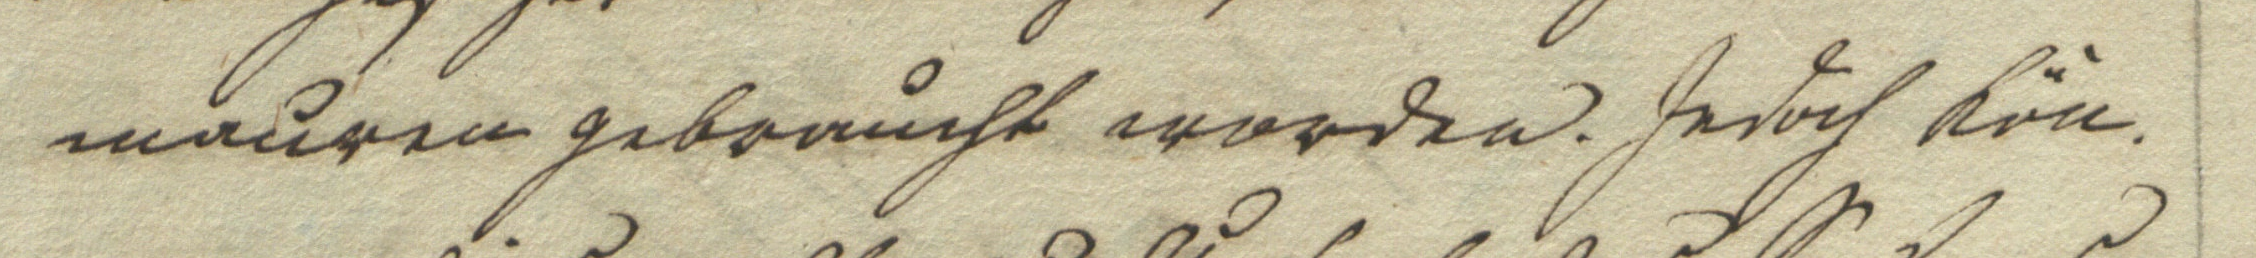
mauren gebraucht worden. Jedoch kön¬
